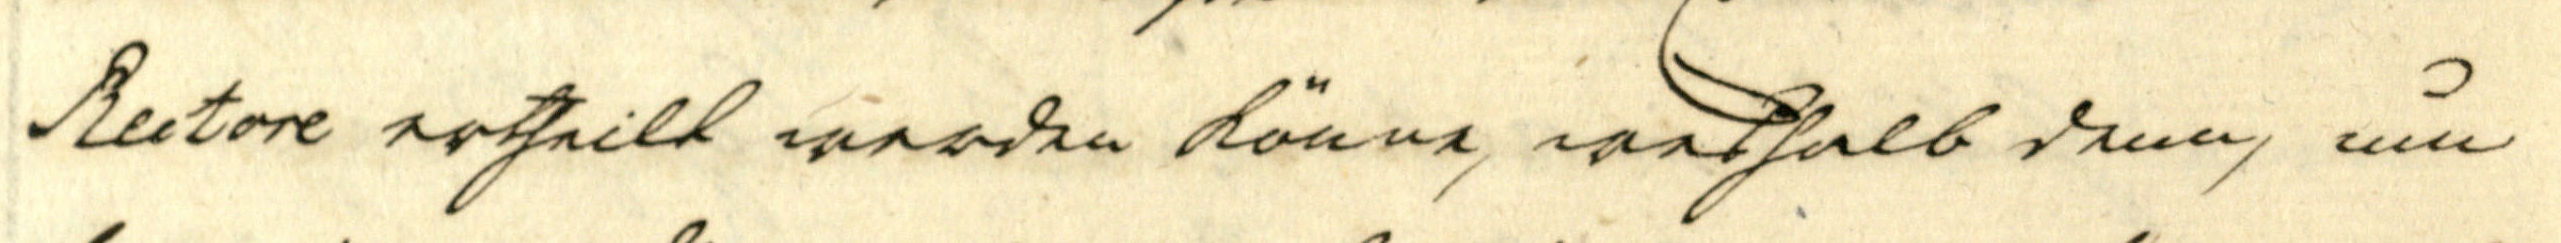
Rectore ertheilt werden könne, weshalb denn, um
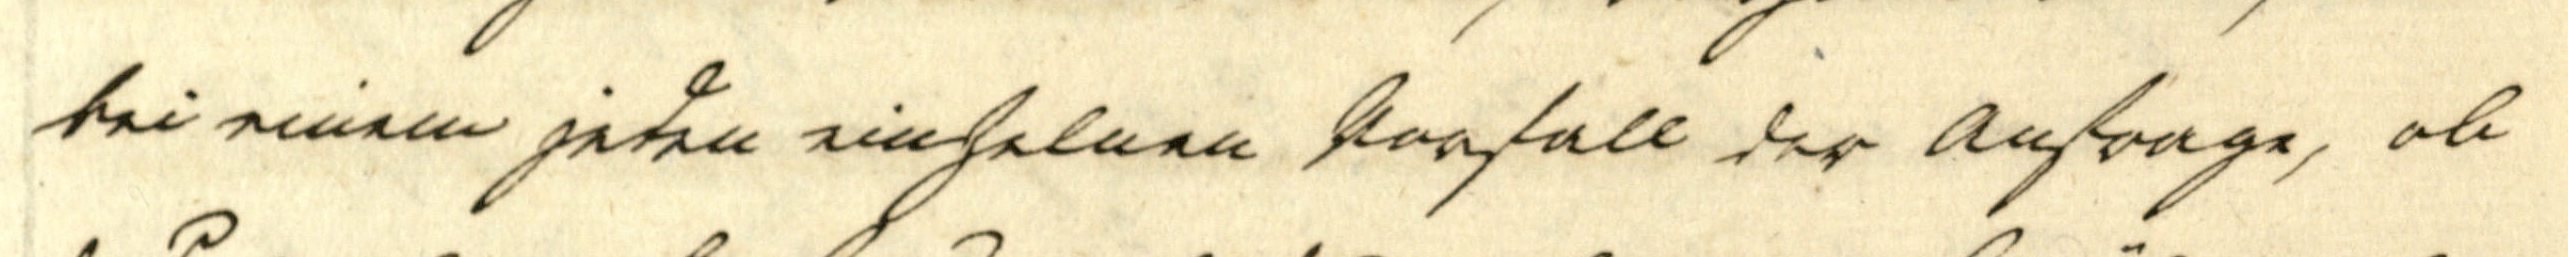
bei einem jeden einzelnen Vorfall der Anfrage, ob
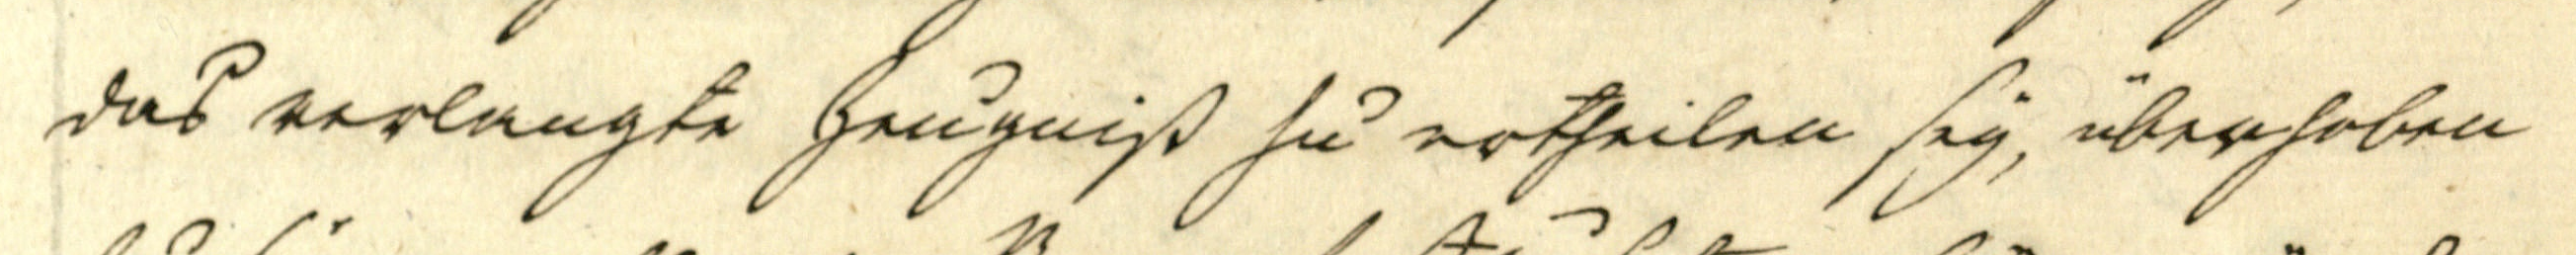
das verlangte Zeugniß zu ertheilen seÿ, überhoben
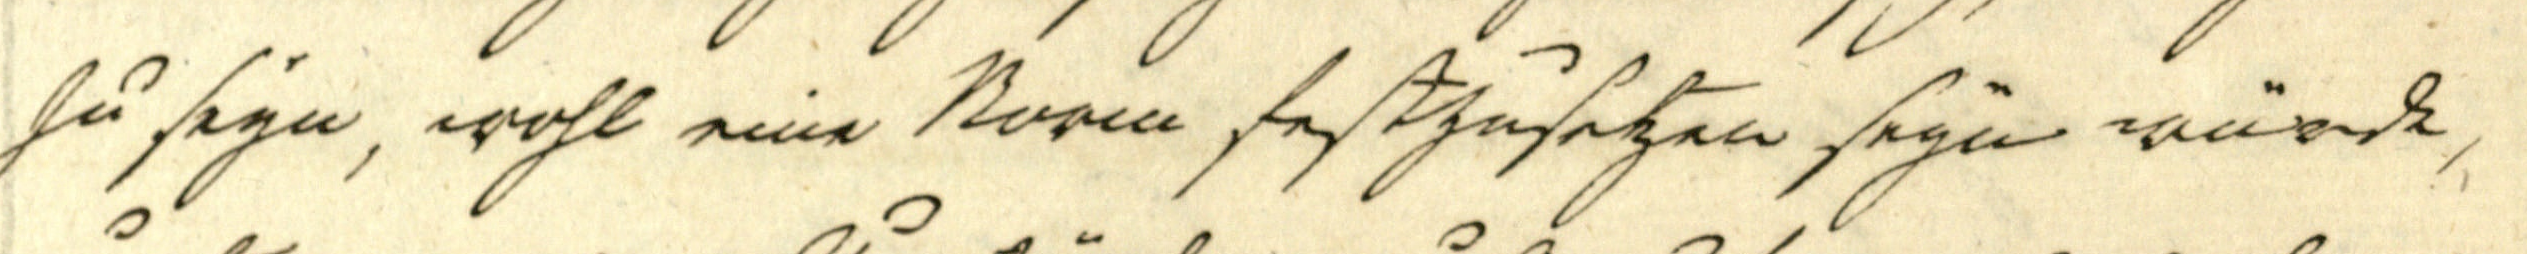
zu seÿn, wohl eine Norm festzusetzen seÿn würde,
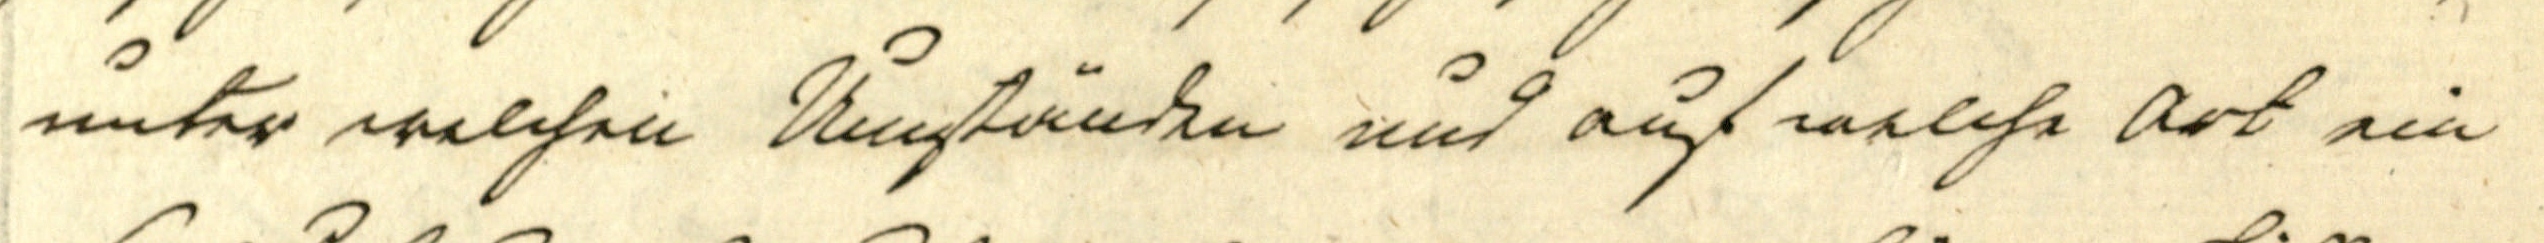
unter welchen Umständen und auf welche Art ein
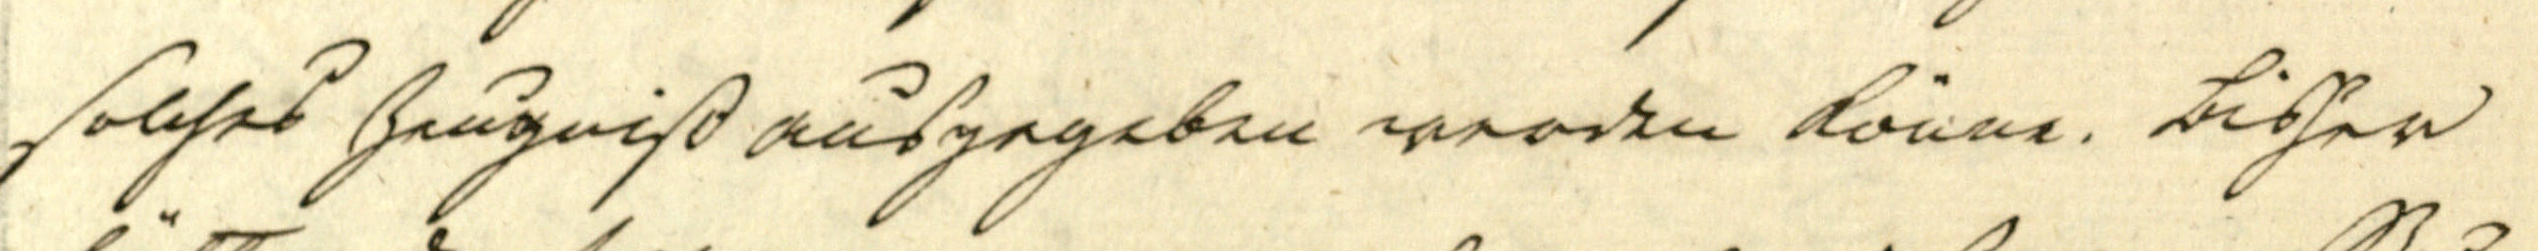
solches Zeugniß ausgegeben werden könne. Bisher
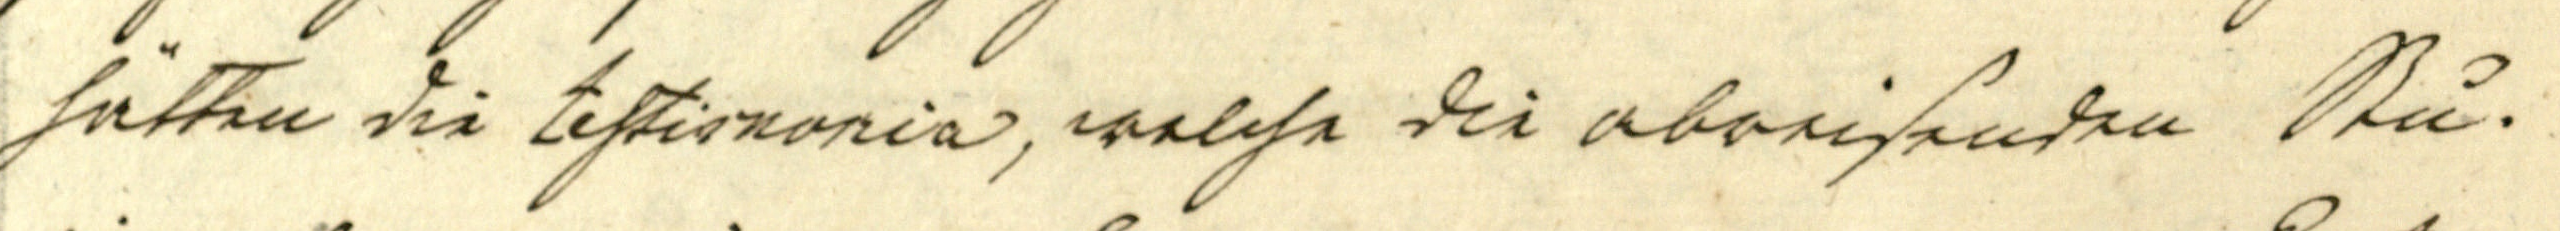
hätten die testimonia, welche die abreisenden Stu¬
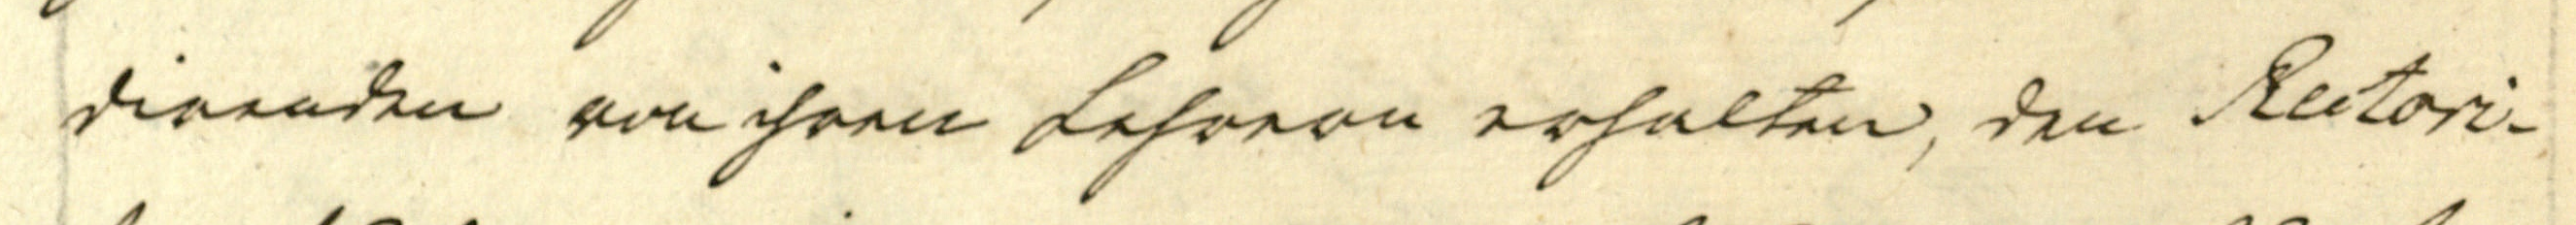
direnden von ihren Lehrern erhalten, den Rectori¬
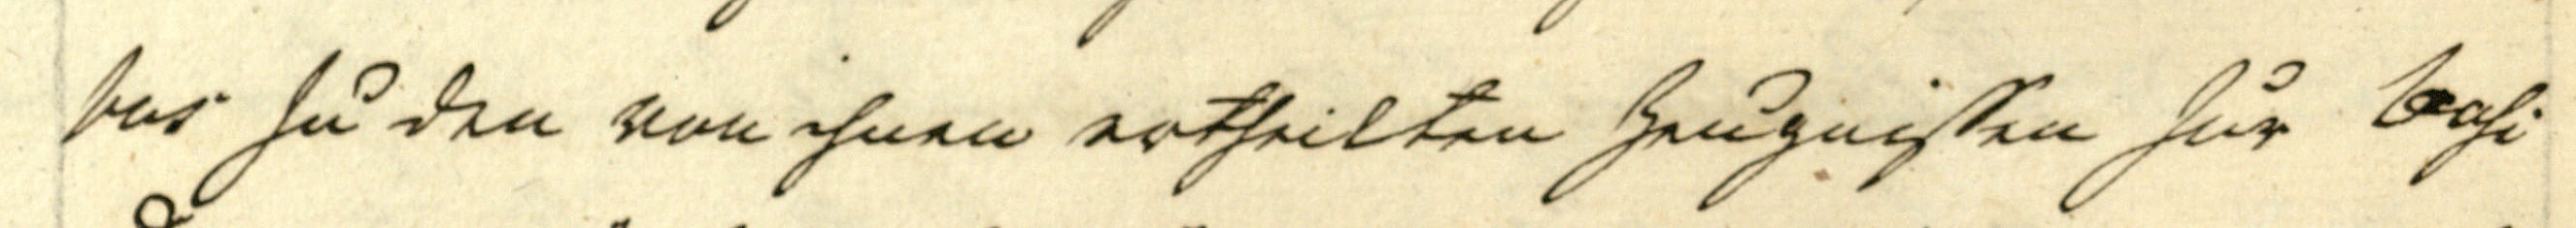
bus zu den von ihnen ertheilten Zeugnissen zur basi
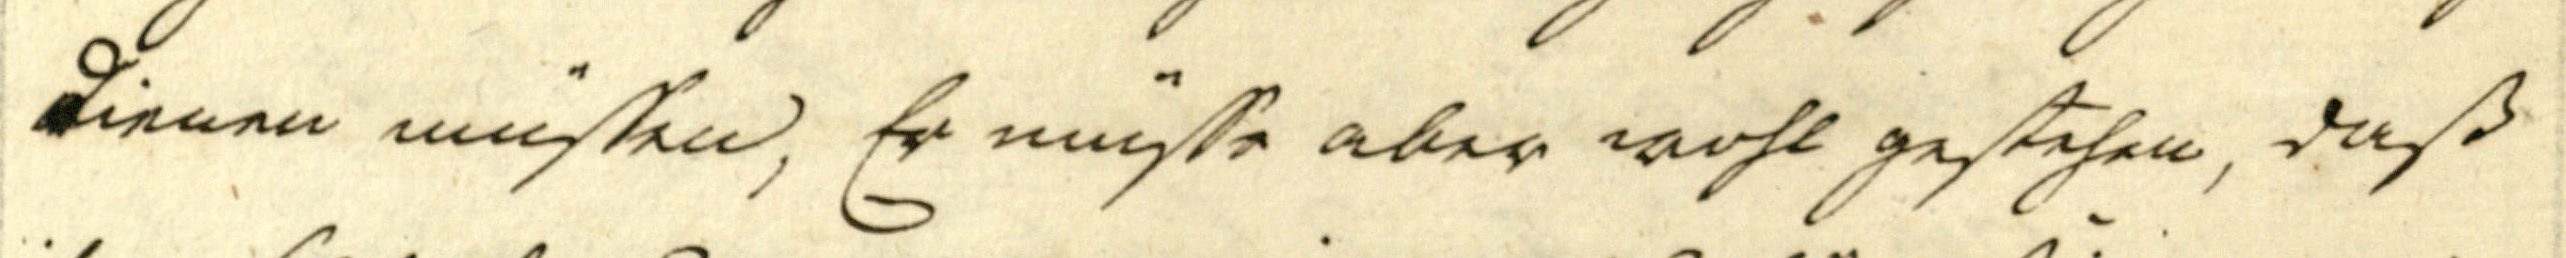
dienen müssen, Er müsse aber wohl gestehen, daß
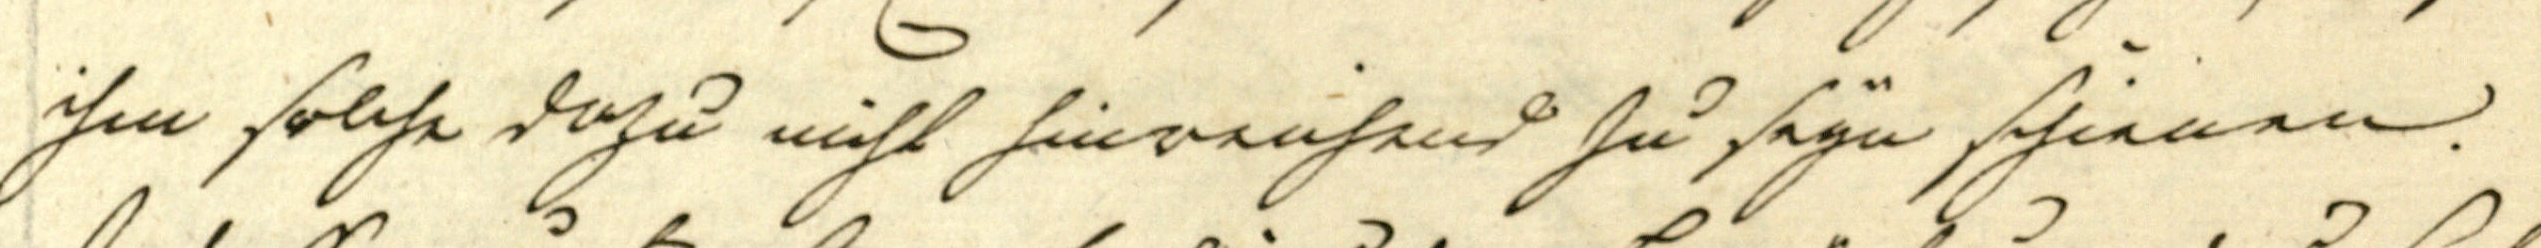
ihm solche dazu nicht hinreichend zu seÿn schienen.
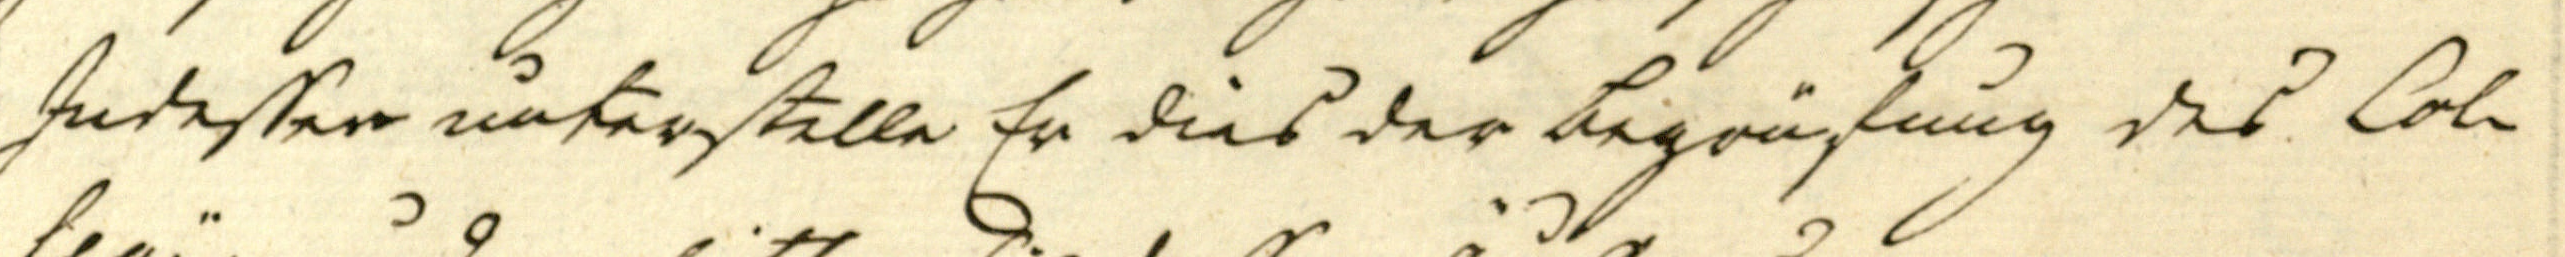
Indessen unterstellte Er dies der Beprüfung des Col¬
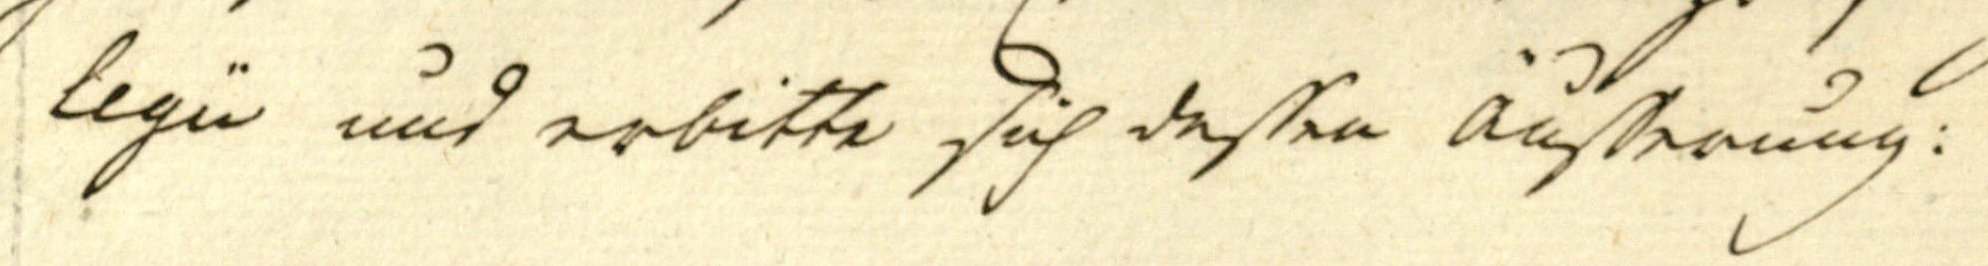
legii und erbitte sich dessen Äusserung:
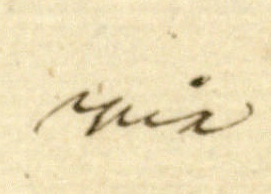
wie
